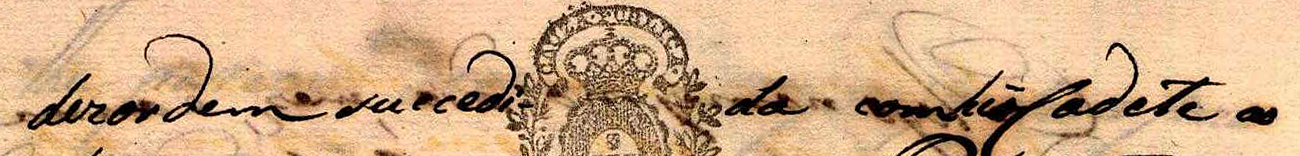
dezordem succedi da com hū Cadete ao
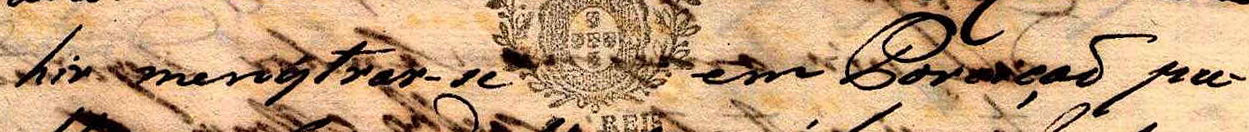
hir menistrar-se em Porciçaõ pu
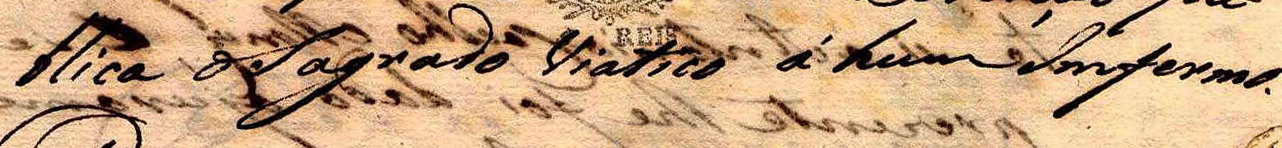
blica o Sagrado Viatico á hum Imfermo.
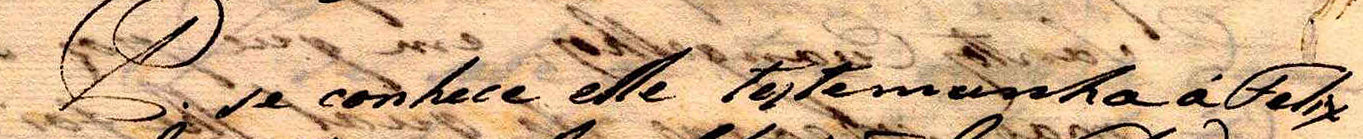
P. se conhece elle testemunha á Felix
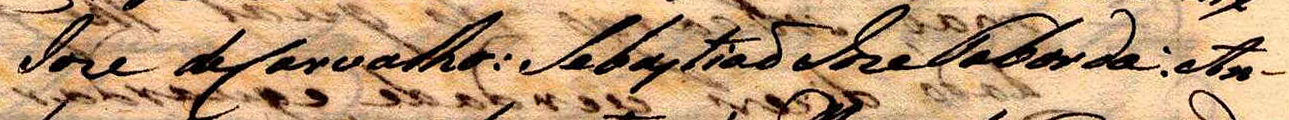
Ioze de Carvalho: Sebastiaõ Ioze Taborda: An
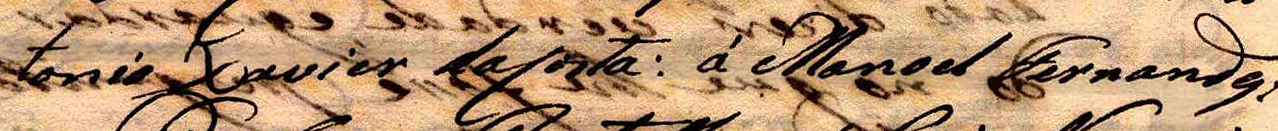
tonio Xavier da Costa: á Manoel Fernandes,
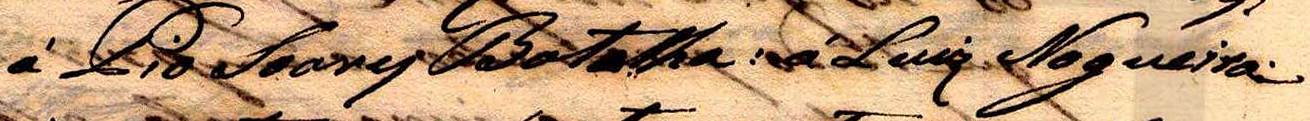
á Pio Soares Batalha: á Luiz Nogueira:
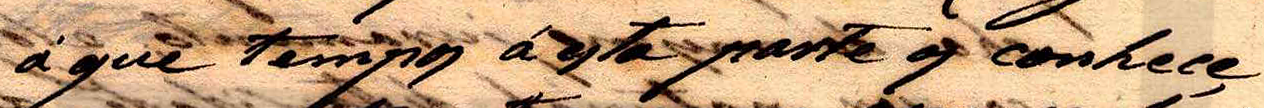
á que tempos á esta parte os conhece
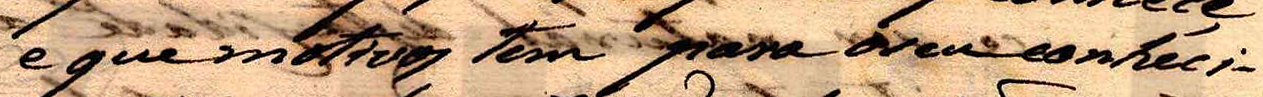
e que motivos tem para o seu conheci
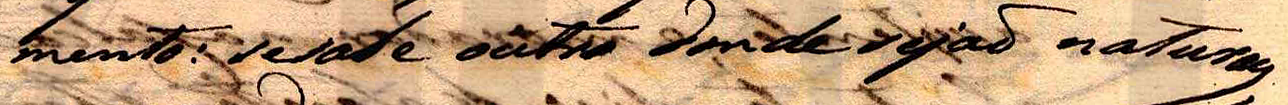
mento: se sabe outro donde sejaõ naturaes,
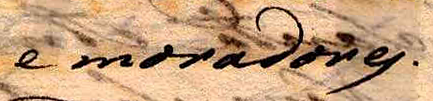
e moradores.
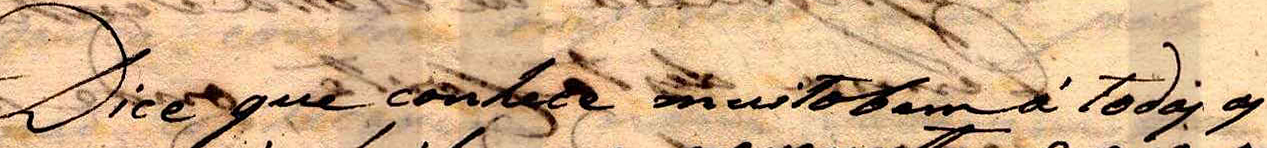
Dice que conhece muito bem á todas as
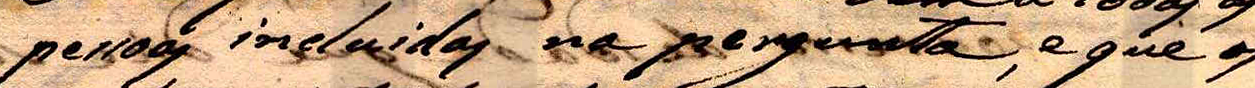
pessoas incluidas na pergunta, e que os
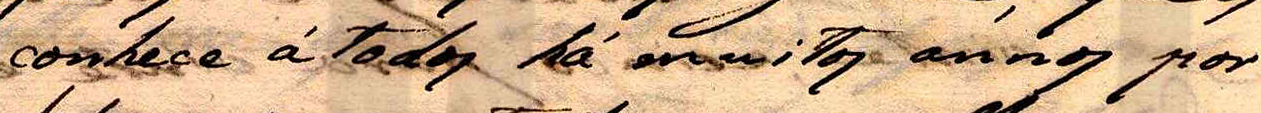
conhece á todos há muitos annos por
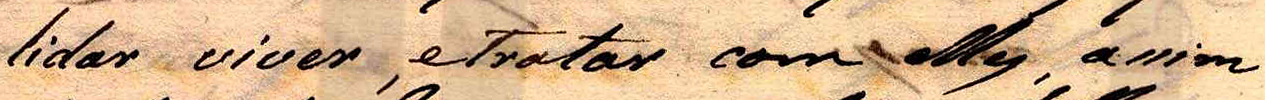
lidar viver, e tratar com elles, assim
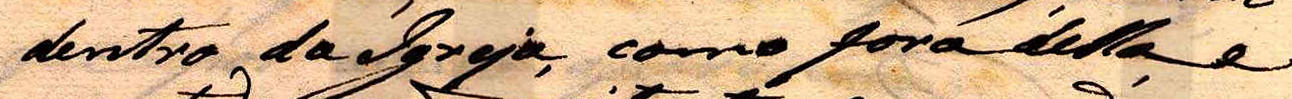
dentro da Igreja, como fora della e
